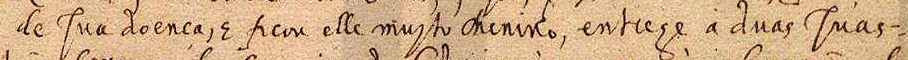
de sua doença, E ficou elle mujto Menino, entrege a duas suas
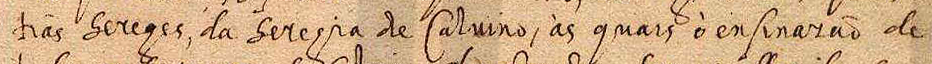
tias hereges, da heregia de Caluino, as quais o ensinaraõ de
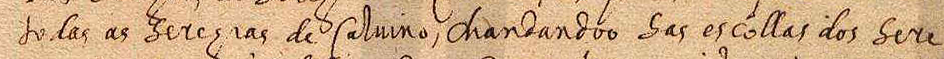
todas as heregias de Caluino, Mandandoo has escollas dos here
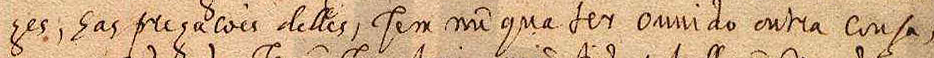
ges, E as pregações delles, sem nūqua ter ouuido outra cousa,
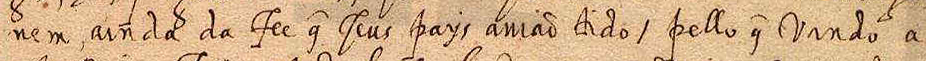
nem ainda da fee q̄ seus pays auião tido, pello q̄ vindo a
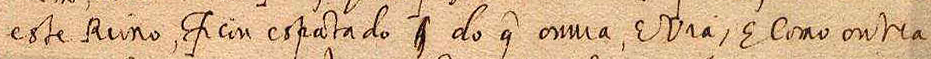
este Reino, ficou espātado q̄ do q̄ ouuia, e via, E como outra
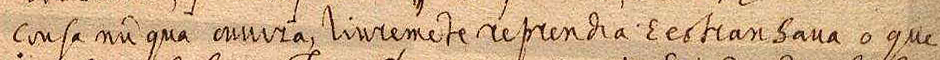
cousa nūqua ouuira, liuremēte reprendia E estranhaua o que
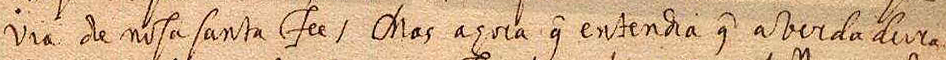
via de nosa santa fee / Mas agora q̄ entendia q̄ a verdadeira
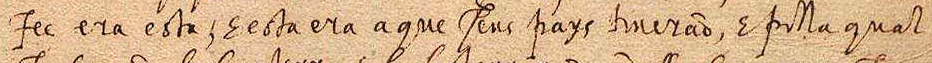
fee era esta, E esta era a que seus pays tiuerão, E pella qual
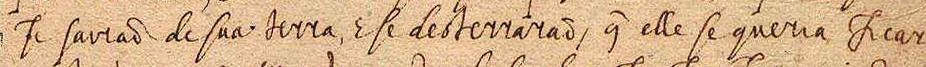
se sairaõ de sua terra, E se desterraraõ, q̄ elle se queria ficar
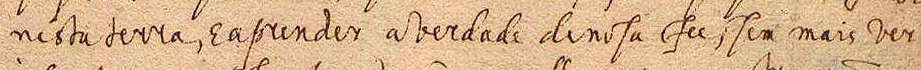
nesta terra, E aprender a verdade de nosa fee, sem mais ver
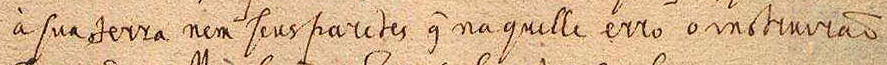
a sua terra nem seus parētes q̄ naquelle erro o instruirão
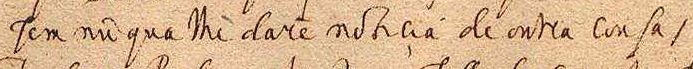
sem nūqua lhe darē noticia de outra cousa /
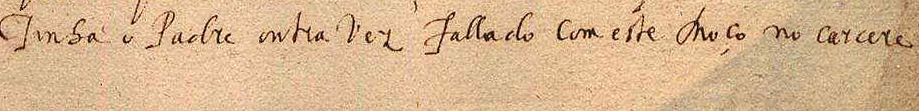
Tinha o Padre outra vez fallado com este Moço no carcere
